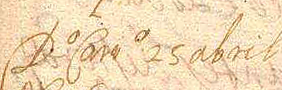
Do Carvo 25 abril
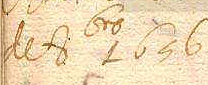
de 8bro 1656
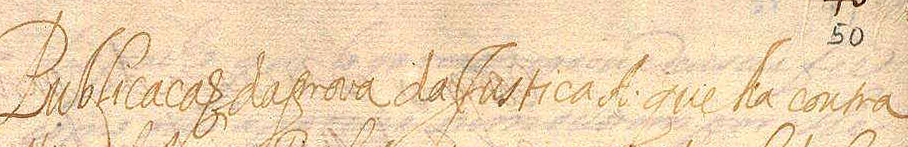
Publicacaõ da prova da Justica A. que ha contra
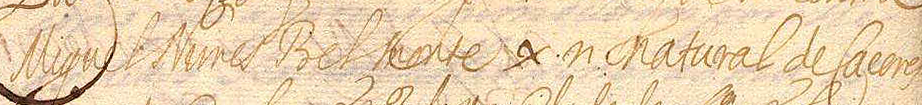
Miguel Nunes Belmonte x. n. natural de Caceres
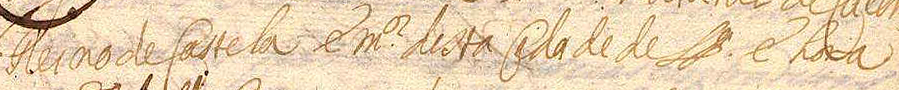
Reino de Castela e mor desta Cidade de Lxa e hora
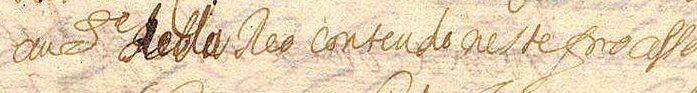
auzte della Reo conteudo neste processo
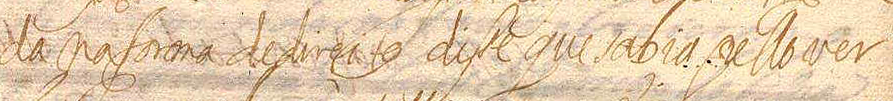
da na forma de direito disse que sabia pello ver
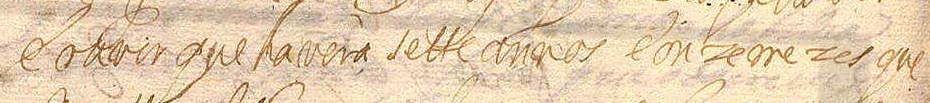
e ouvir que hauera sette annos e onze mezes que
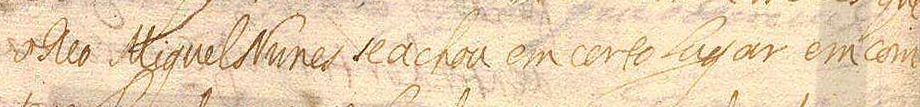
o Reo Miguel Nunes se achou em certo lugar em com
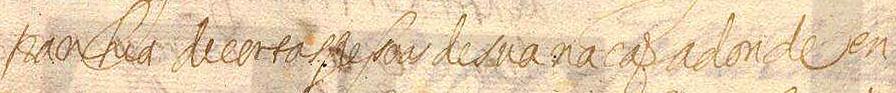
panhia de certas pessoas de sua naçaõ adonde en
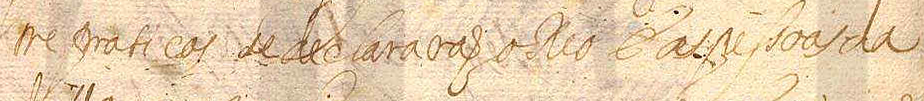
tre praticas se declararaõ o Reo e as pessoas da
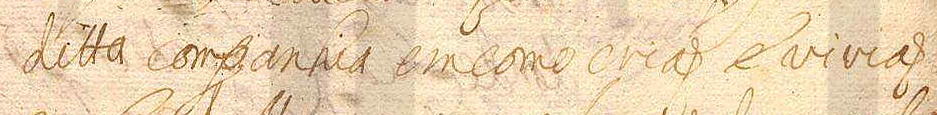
ditta companhia em como criaõ e viviaõ
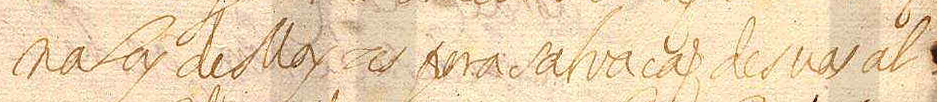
na Ley de Moyzes pera salvação de suas al
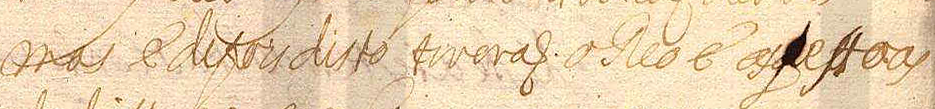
mas e depois disto tiveraõ o Reo e as pessoas
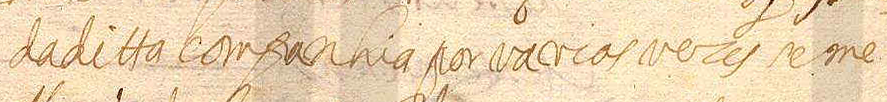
da ditta companhia por varias vezes seme
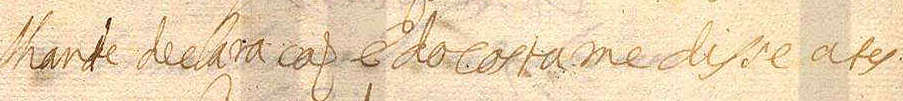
lhante declaraçaõ e do costume disse a tes
